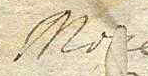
Mo__e
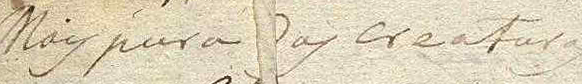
Mais pura das creaturas
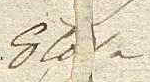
Glosa
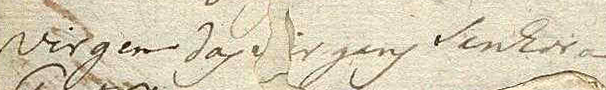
Virgem das _irgens Senhora
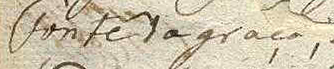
Fonte da graça,
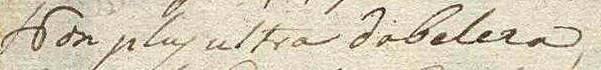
Non plus ultra da beleza,
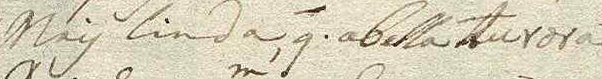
Mais linda, q̄ a bella Aurora.
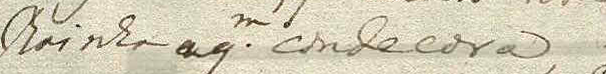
Rainha a q.m condecora,
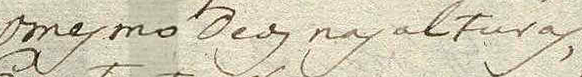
o mesmo Deos nas alturas,
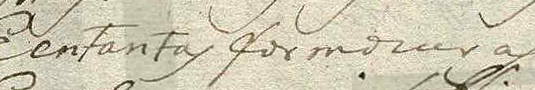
E en tantas formozuras,
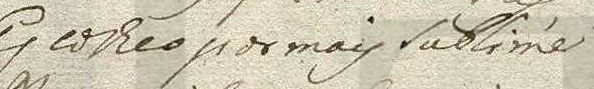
Escolheo por mais Sublime
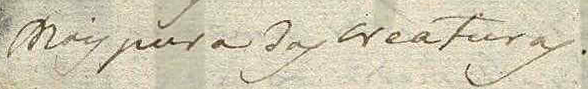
Mais pura das creaturas.
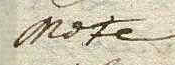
Mote
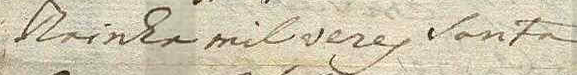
Rainha mil vezes Santa
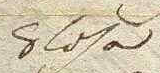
Glosa
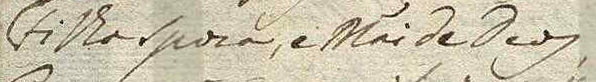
Filha spoza, e Mãi de Deos,
